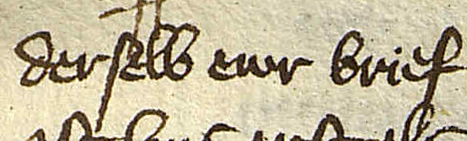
derſelb ewr brief
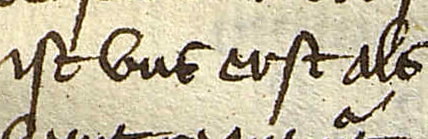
iſt vns erſt als
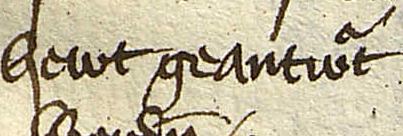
hewt geantwt*
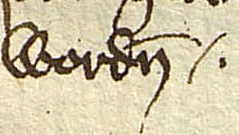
wordn* / .
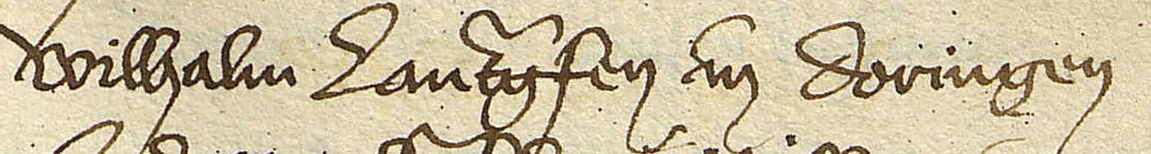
Wilhalm Lantg*fen in Doringen
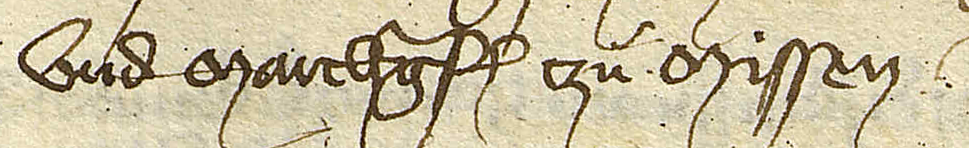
vnd Marchg*f* cʒü Miſſen /
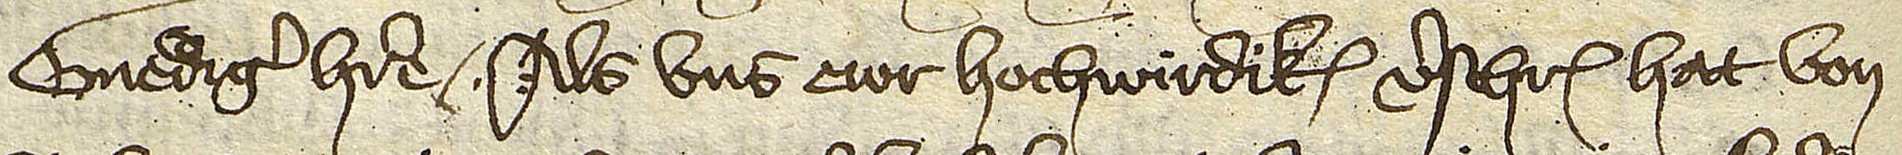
Gnedig* hr*e / . Als vns ewr hochwirdik* v*ſchr* hat von
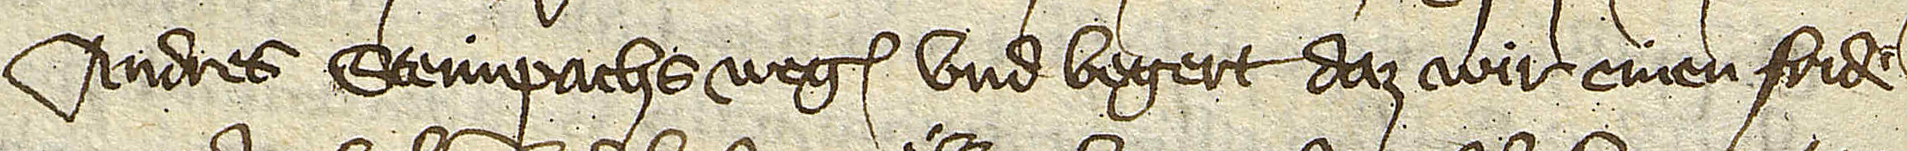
Andres Steimpachs weg* vnd begert daʒ wir einen fride
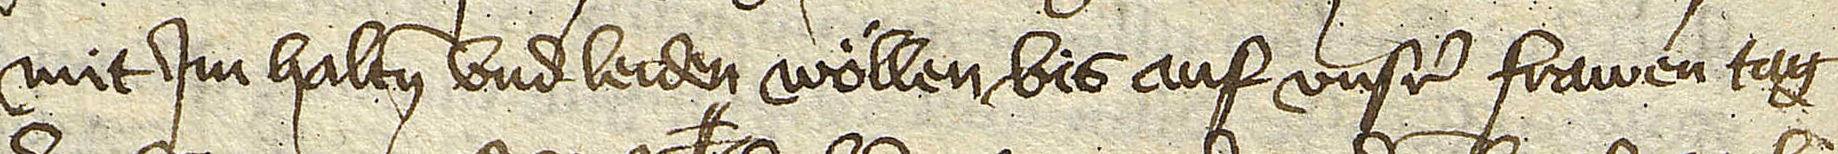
mit Im haltn* vnd leiden wöllen / bis auf vnſr* frawen tag
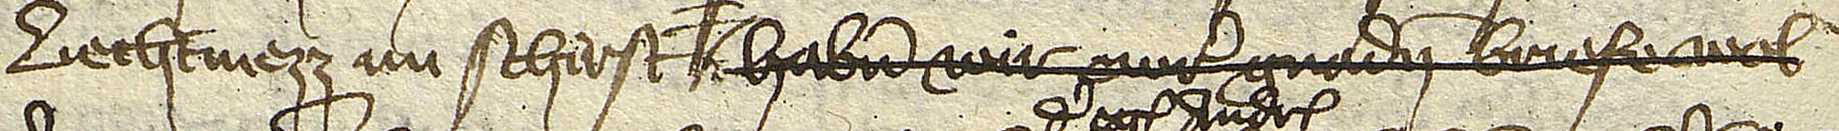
Liechtmeʒʒ im ſchirſt / habn* wir ewr* gnadn* briefe wol
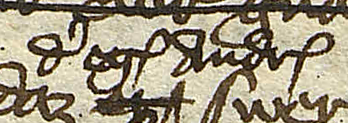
d* eg Andr*
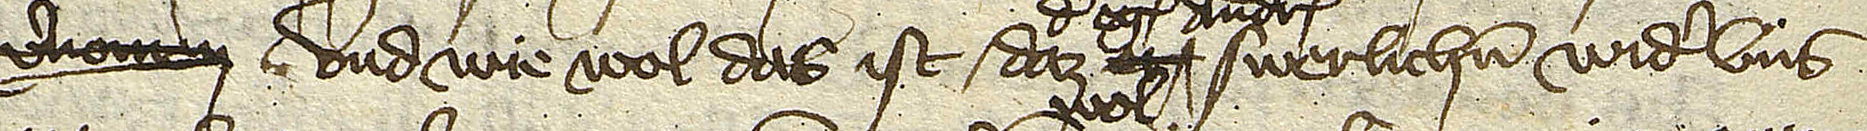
v*nomen / vnd wie wol das iſt / daʒ er ſwerlichn* wid* vns
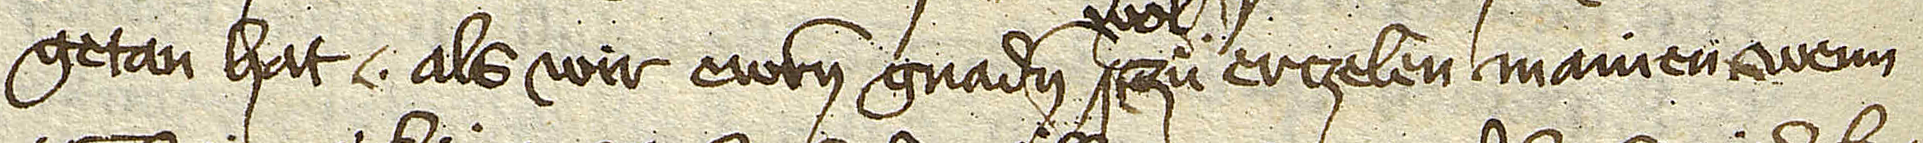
getan hat / . als wir ewrn* gnadn* cʒü ercʒelen mainen wenn
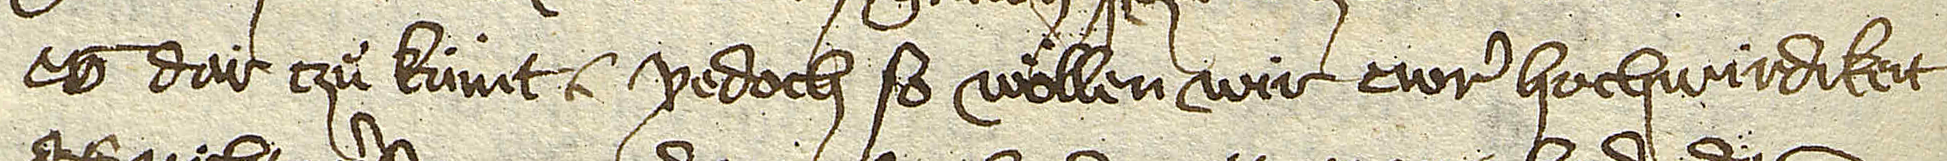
es dar cʒü kümt / yedoch wöllen wir ewr* hochwirdikeit
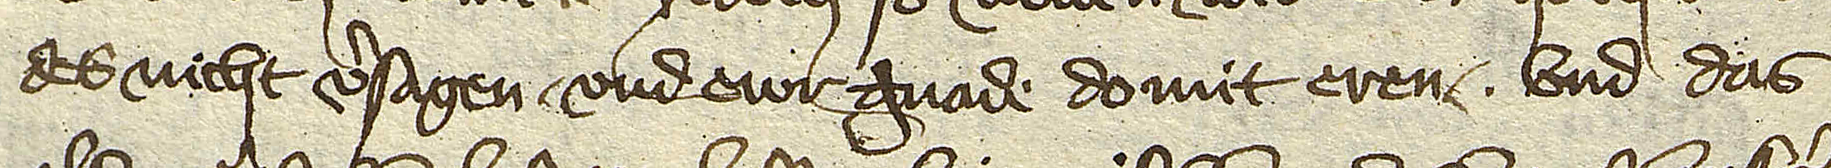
des nicht v*ſagen / vnd ewr gnade do mit eren / . vnd das
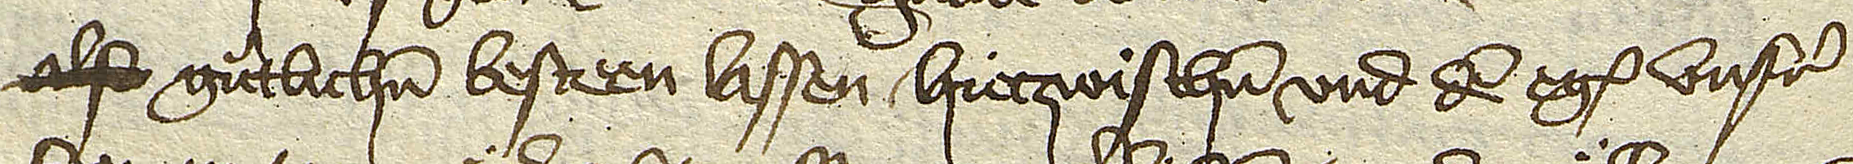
alſo gütlichn* beſteen laſſen / hiecʒwiſchn* vnd d* eg* vnſr*
